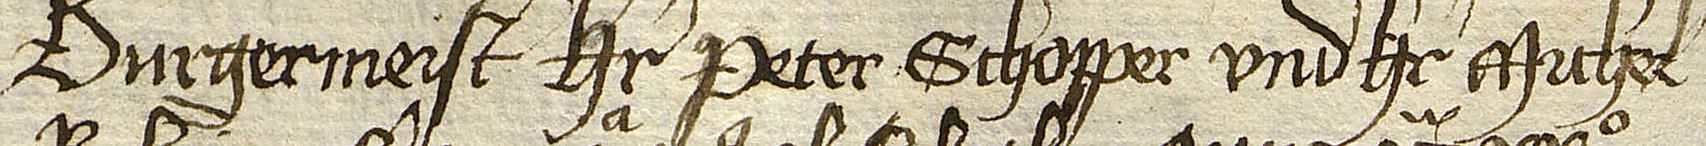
Burgermeist* Hr* Peter Schopper vnd Hr* Michel
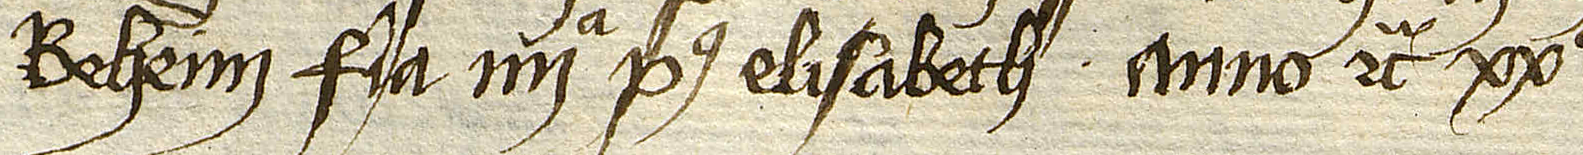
Beheim fi*a iiii* p* eliabeth . anno ec* xx*
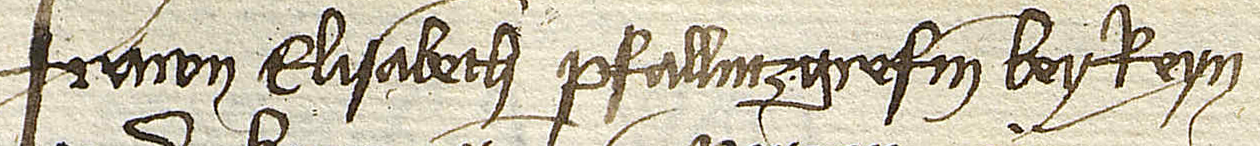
Frawn Eliſabeth pfallncʒgrefin bey Reyn
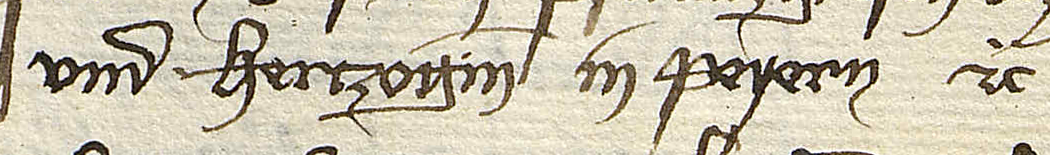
vnd hercʒogin in Peyern ec*
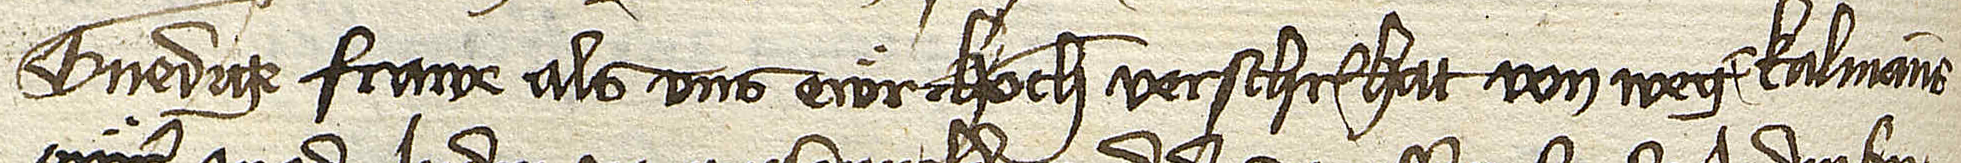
Gnedige frawe als vns eẅr Hoch* verſchr* hat von weg* kalman*s
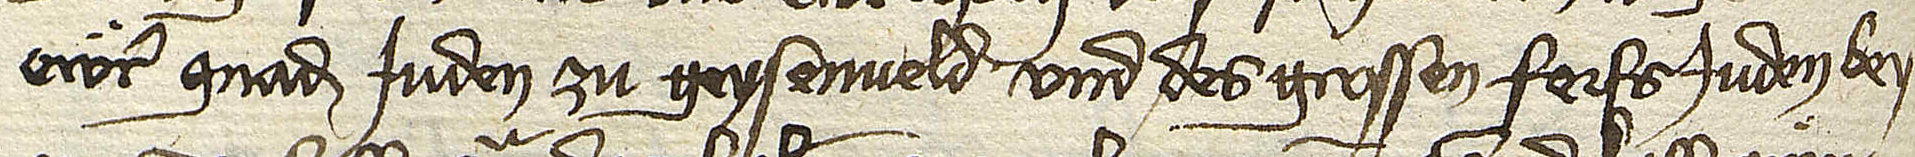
eẅr* gnad* Iuden ʒu geyſenueld . vnd des groſſen feifs Iuden bey
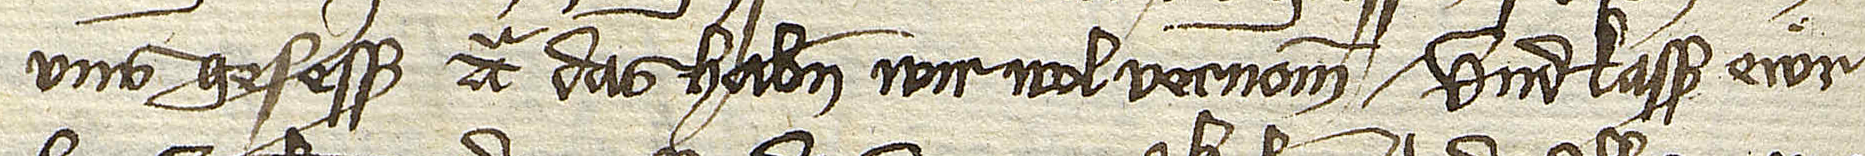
vns geſeſſ* ec* das habn* wir wol vernom* / Vnd laſſ* eẅr
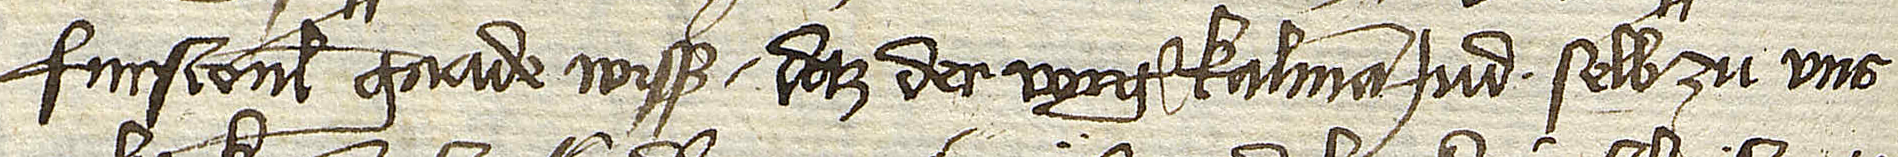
furſtenl* gnade wiſſ* / daʒ der vorg* kalma* Iud. ſelb ʒu vns
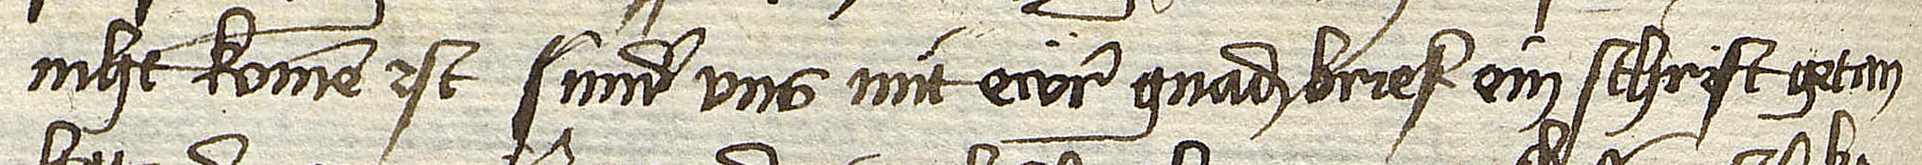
niht kome* iſt ſund* vns mit eẅr* gnad* brief ein ſchrift getan
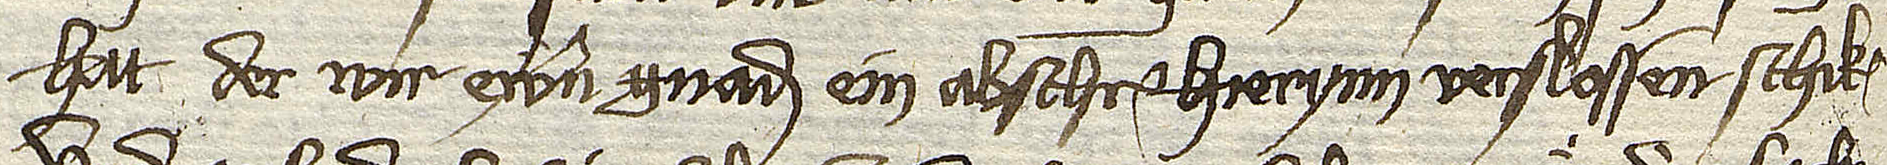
hat der wir eẅ*n gnad* ein abſchr* hierynn verſloſſen ſchik*
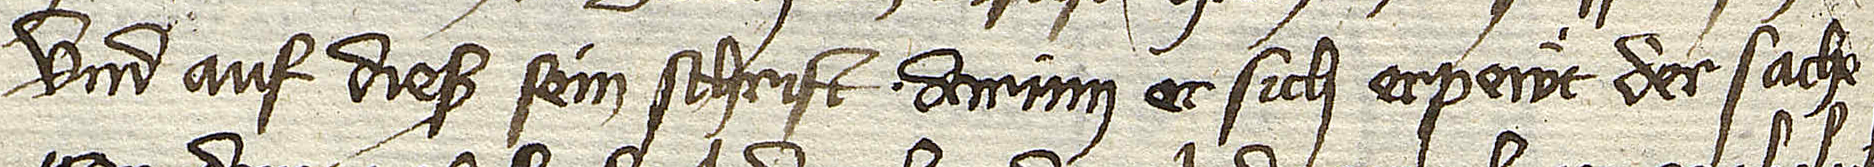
Vnd auf dieſ* ſein ſchrift . darinn er ſich erpeẅt der ſache
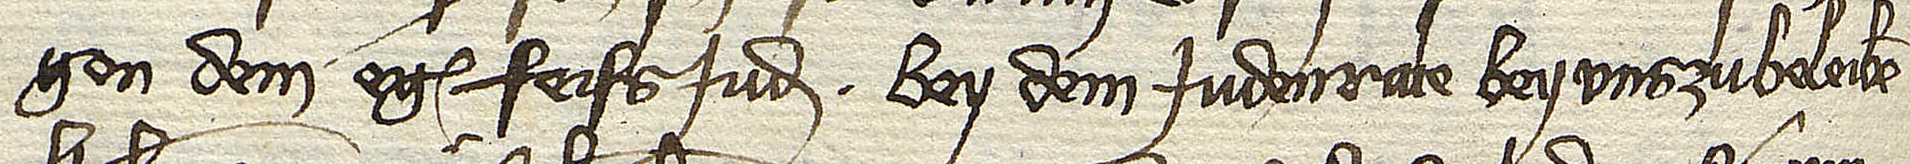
gen dem eg* feifs Iud* / bey dem Iudenrate bey vns ʒu beleibe*
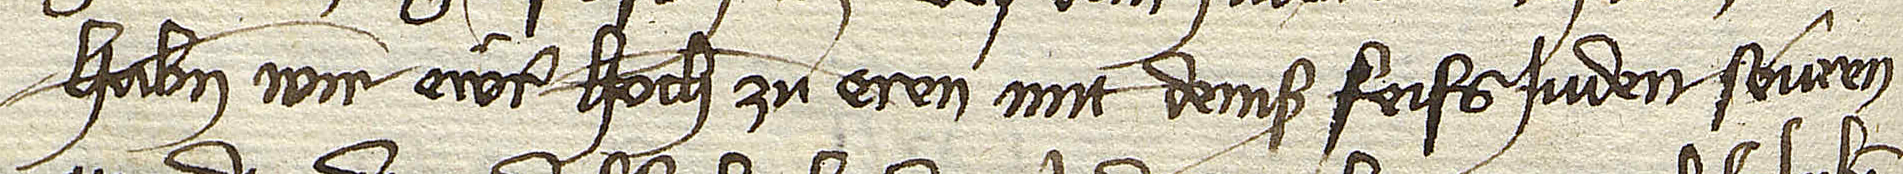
habn* wir eẅr* hoch* ʒu eren mit demſ* feifs Iuden ſou*ren
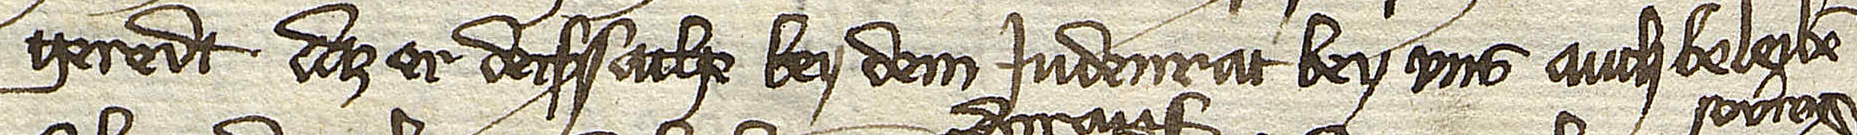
geredt . Daʒ er derſ*ſache bey dem Iudenrat bey vns auch beleibe*
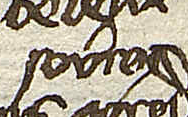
ſou*ren
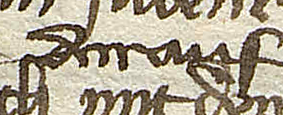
darauf
